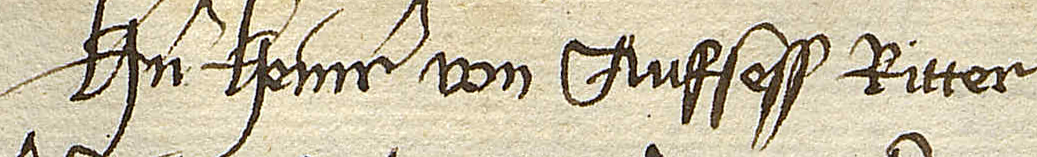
Hn* Heinr* von Aufſeſſ Ritter
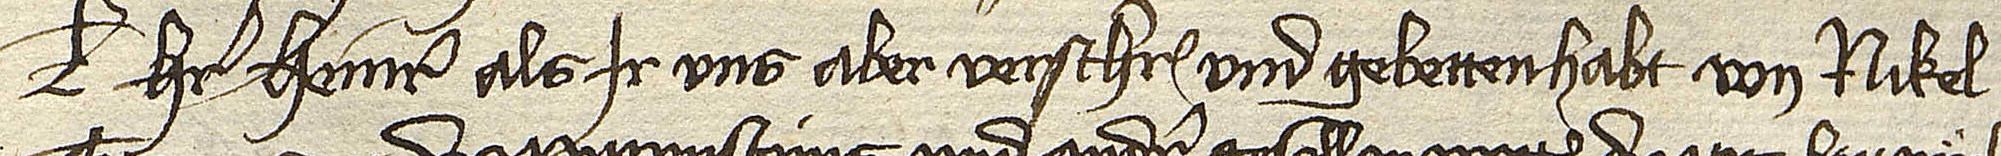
L* Hr* Heinr* als Ir vns aber verſchr* vnd gebetten habt von Nikel
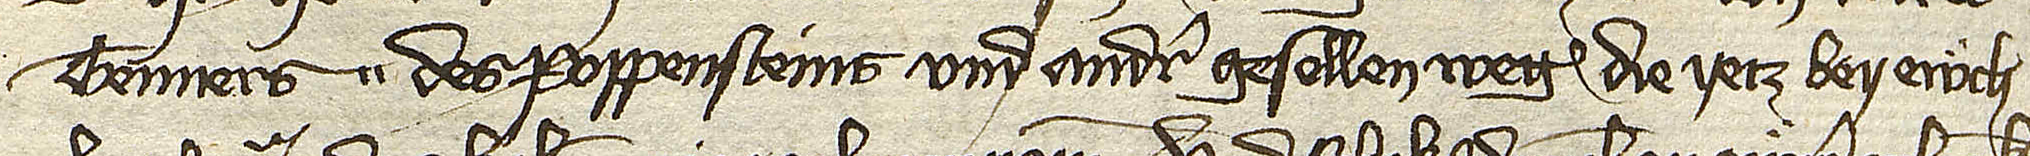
Tenners ~ Des Poppenſteins vnd andr* geſellen weg* die yecʒ bey eẅch
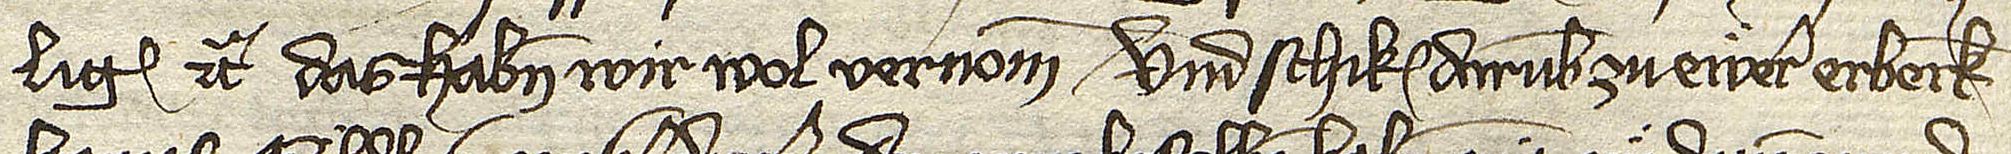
lig* ec* das habn* wir wol vernom* / Vnd ſchik* darub* ʒu eẅer* erberk*
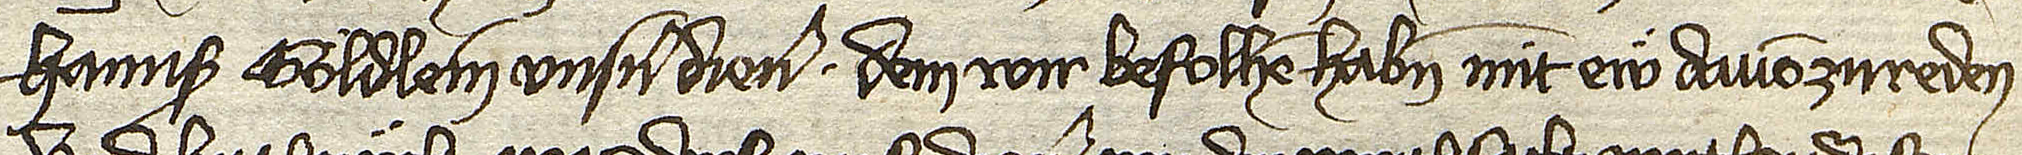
hannſ* Göldlein vnſn* dien* . Dem wir befolhe* habn* mit eẅ dauo* ʒureden
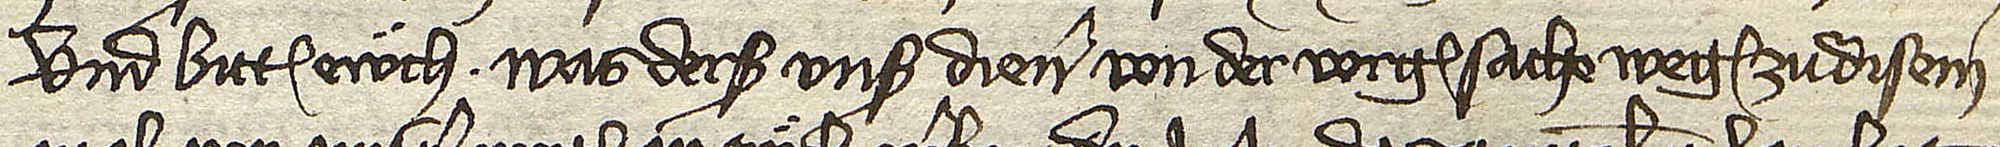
Vnd bitt* eẅch . was derſ* vnſ* dien* von der vorg* ſache weg* ʒu diſem
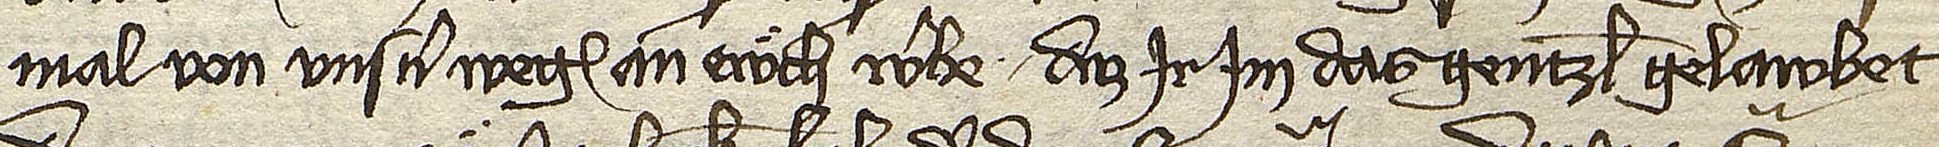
mal von vnſn* weg* an eẅch w*be . / daʒ Ir Im das gencʒl* gelawbet
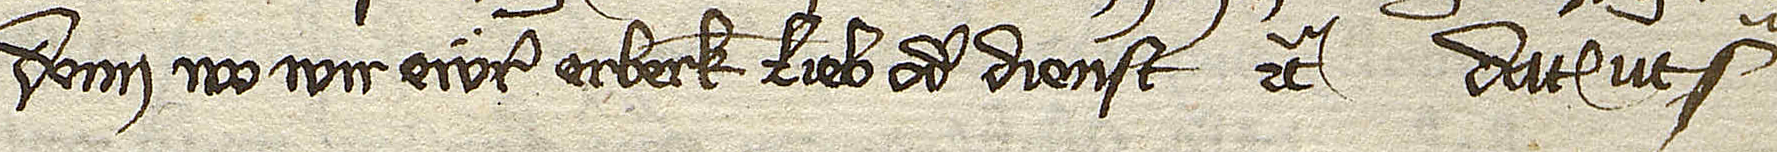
Denn wo wir eẅr* erberk* lieb od* dienſt ec* Dat* ut ſ*
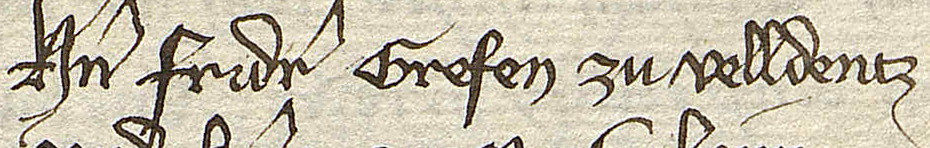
Hn* Fridr* Grefen ʒu velldencʒ
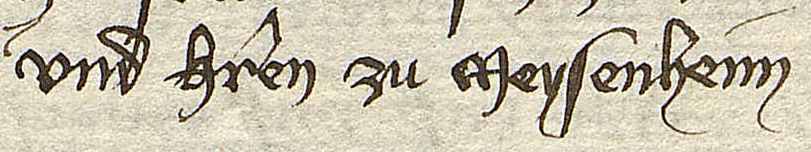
vnd h*ren ʒu Meyſenheim
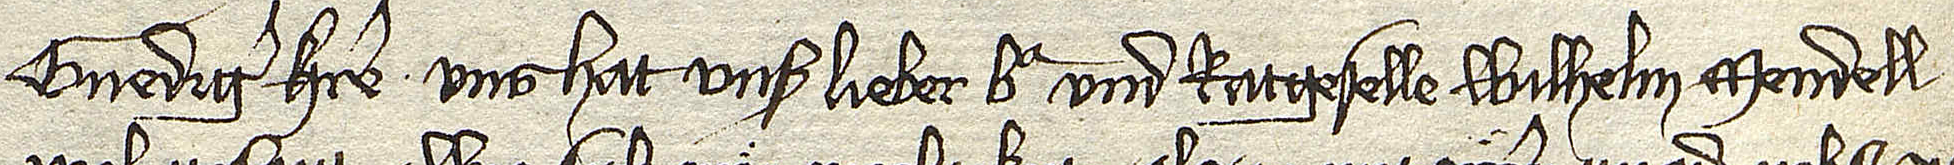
Gnedig* h*re . vns hat vnſ* lieber b* vnd Ratgeſelle Wilhelm Mendell
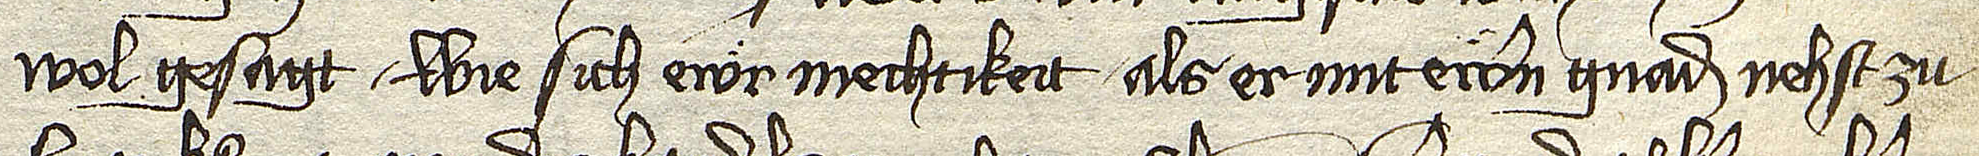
wol geſagt / Wie ſich eẅr mechtikeit / als er mit eẅ*n gnad* nehſt ʒu
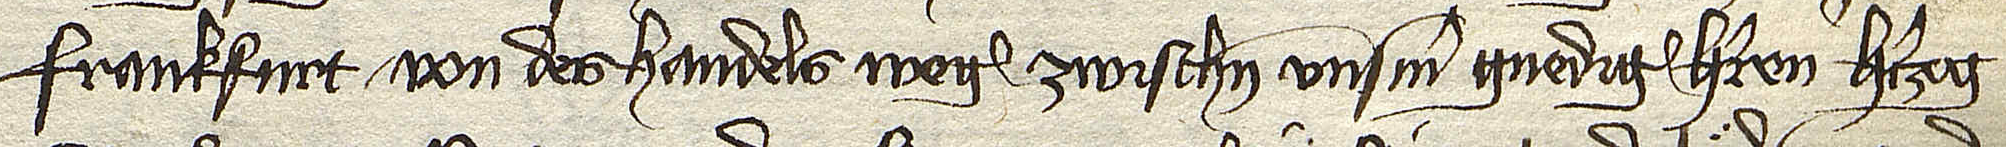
Frankfurt / von des handels weg* ʒwiſchn* vnſm* gnedig* h*ren h*cʒog
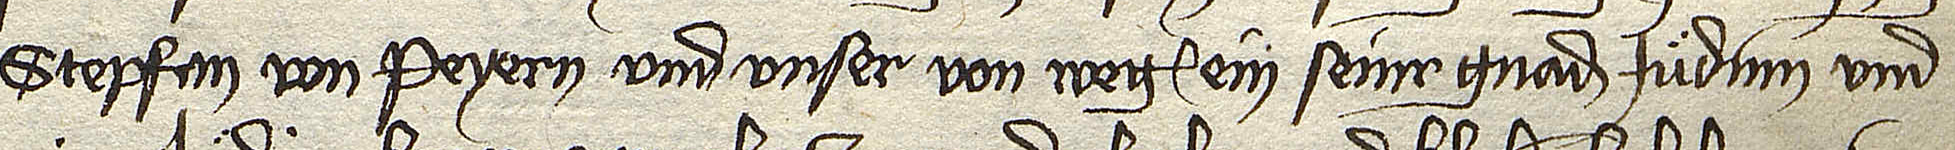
Stepfan von Peyern vnd vnſer von weg* ein ſeinr gnad* Iüdinn vnd
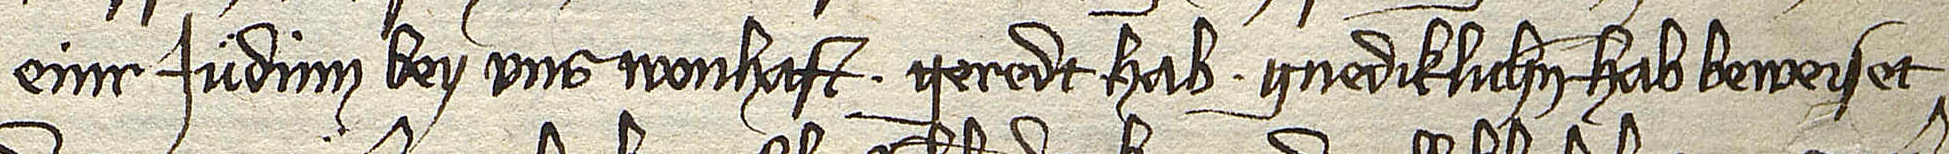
einr Iüdinn bey vns wonhaft . geredt hab . gnediklichn* hab beweiſet
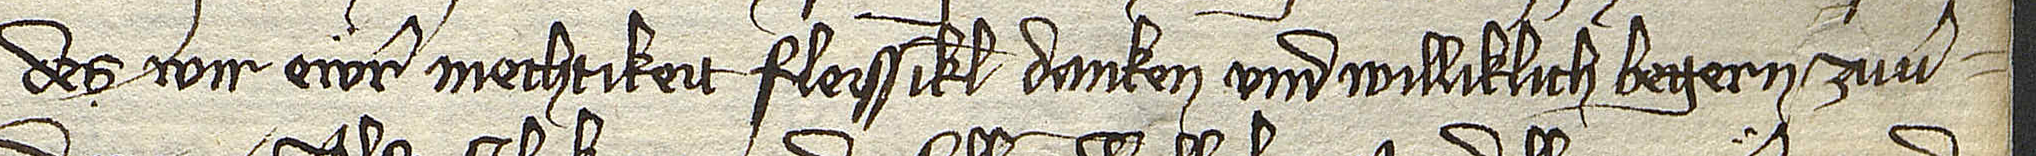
des wir eẅr* mechtikeit fleiſſikl* danken vnd williklich begern ʒuu* =
